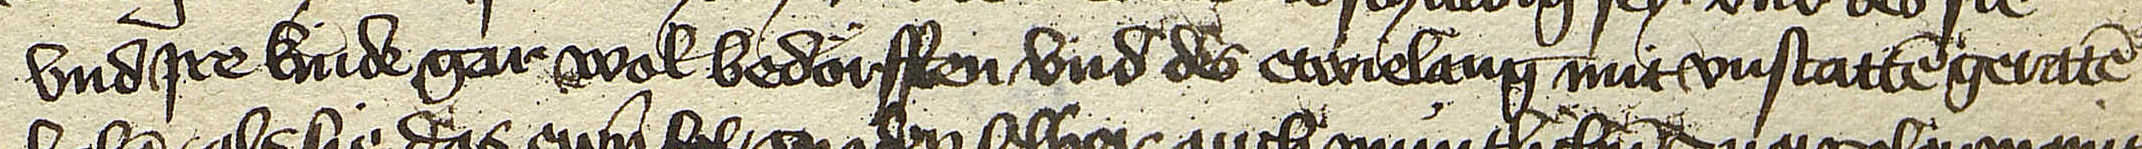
vnd Ire kinde gar wol bedörfften / vnd des etwielang mit vnſtatte* gerate*
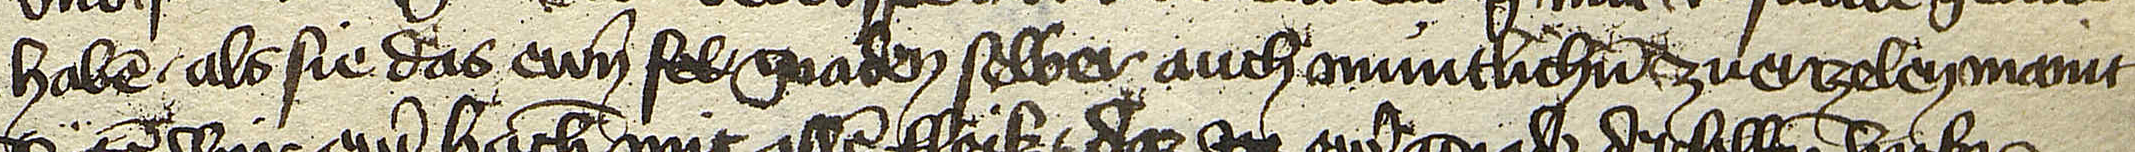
habe* / als ſie das ew*n ſel gnaden ſelber auch müntlichn* cʒu ercʒelen maint
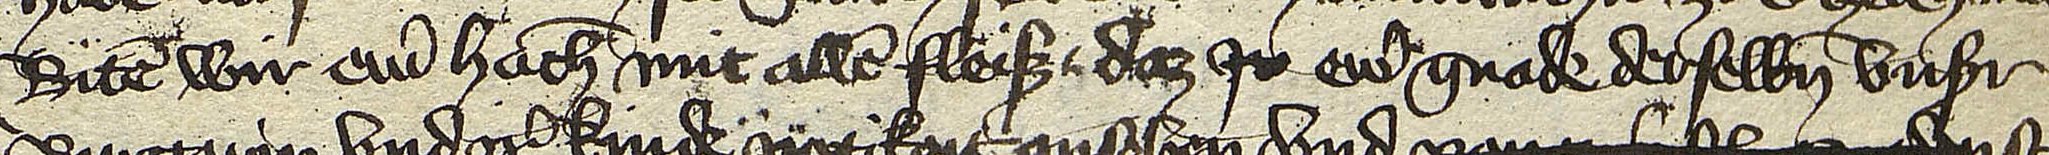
Bite* wir ew* hoch* mit alle* fleiſʒ / daʒ Ir ew* gnade derſelbn* vnſ*r
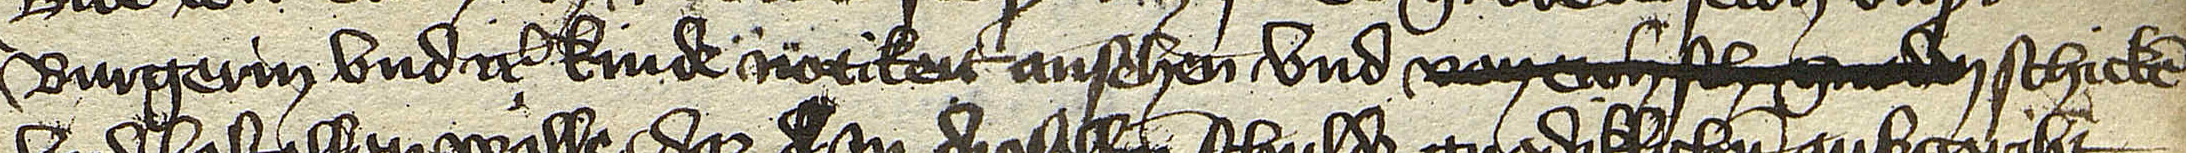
Burgerin vnd ir* kinde notikeit anſehen / vnd von ew*n ſch gnaden ſchicke*
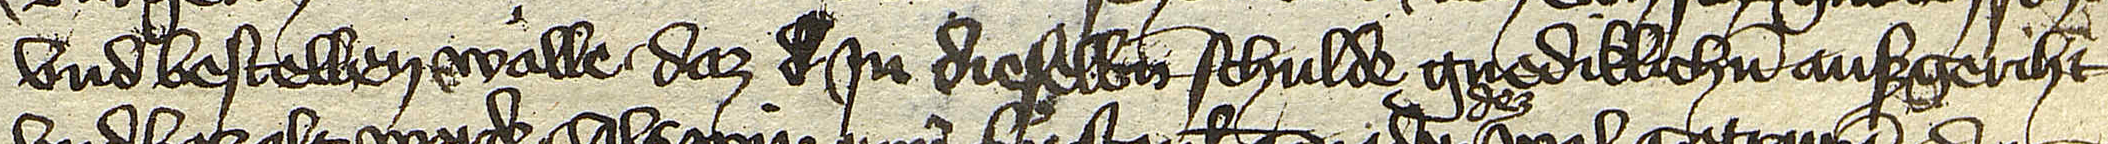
vnd beſellen wölle / daʒ d In dieſelbn* ſchulde gnediklichn* auſʒgeriht
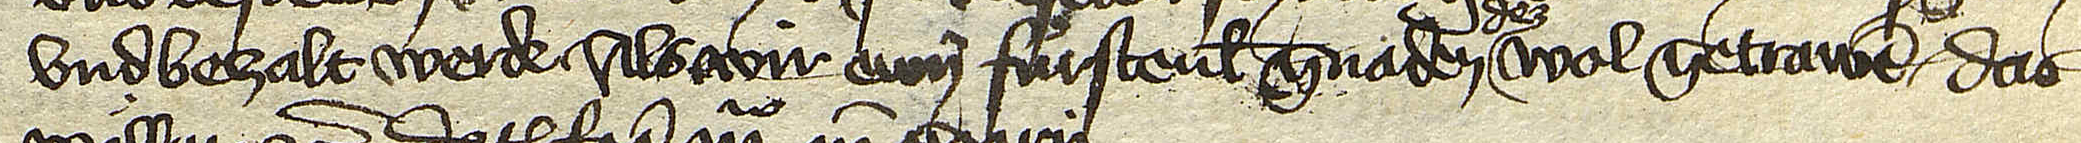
vnd becʒalt werde / Als wir ewn* fürſtenl* gnaden wol getrawe* / das
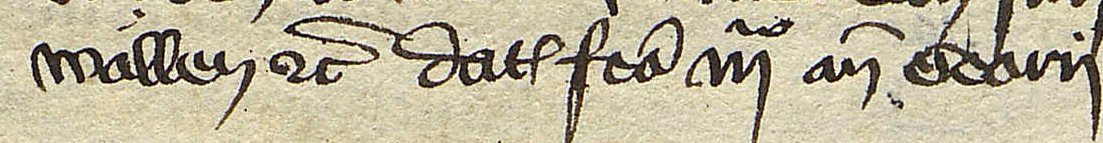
wöllen ec* dat* fea* iii* an* Georii*
